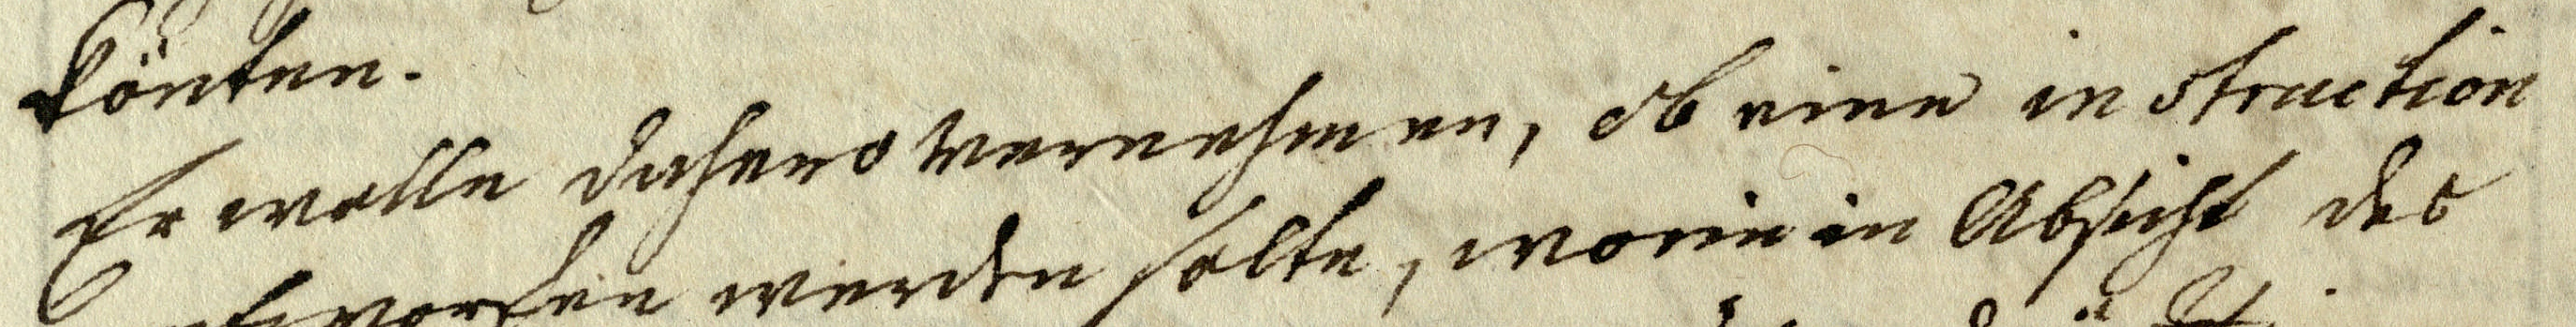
Er wolle dahero vernehmen, ob eine instruction
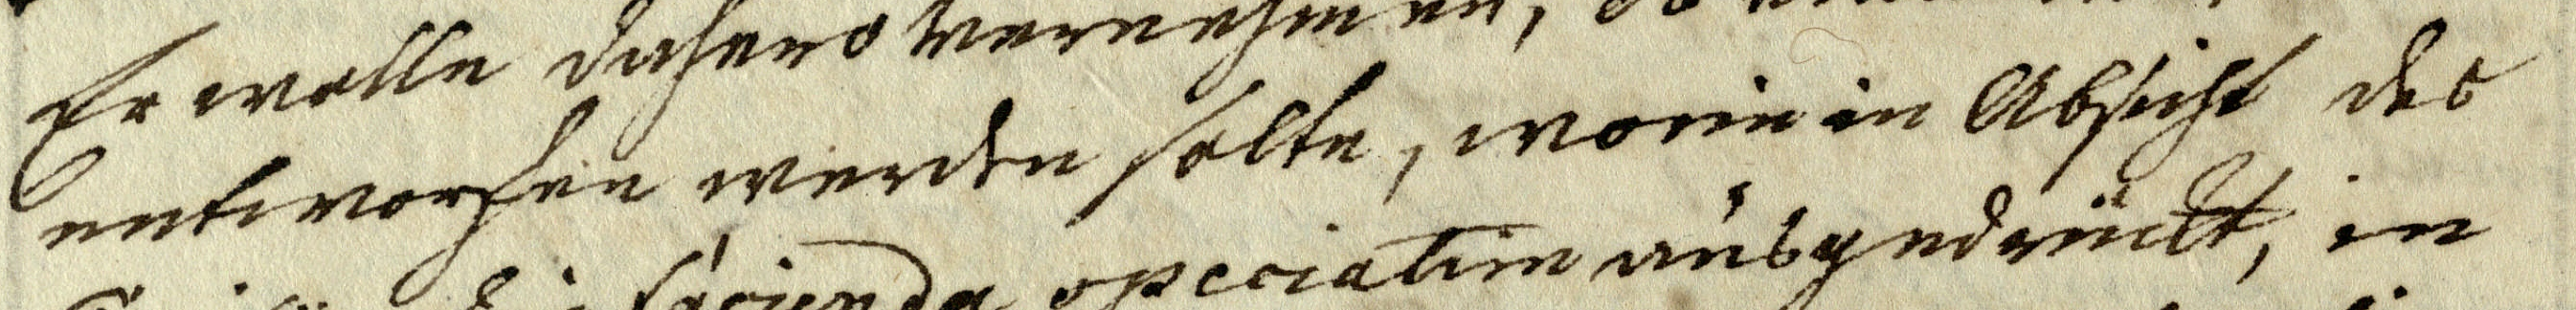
entworfen werden solte, worin in Absicht des
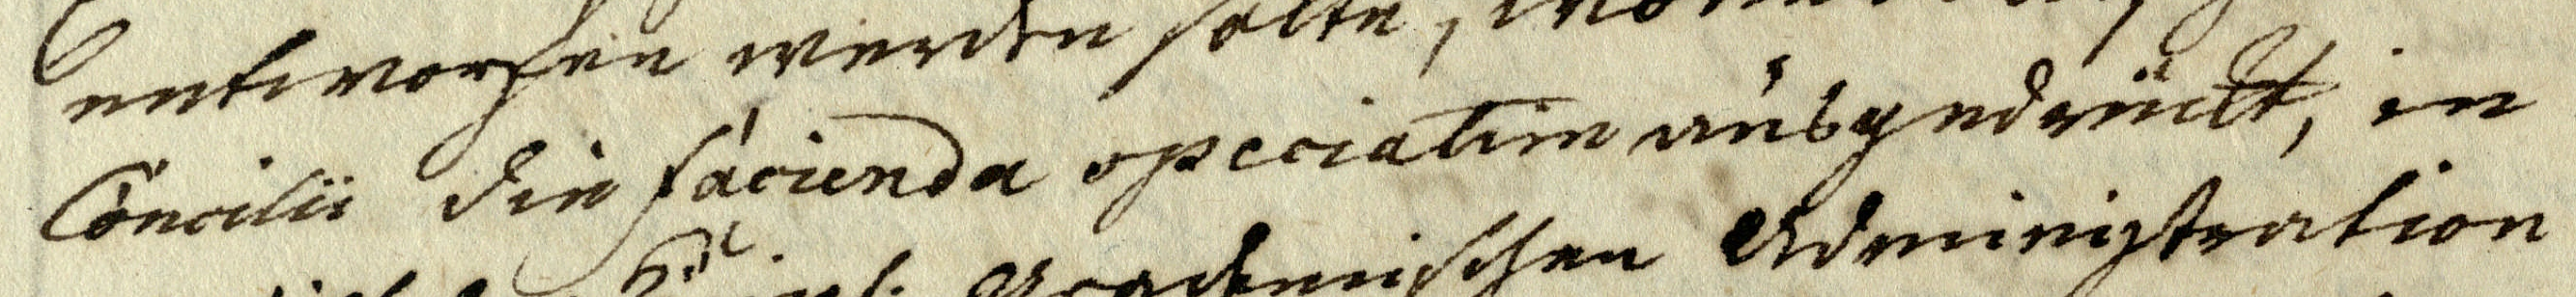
Concilii die Facienda opeciatim ausgedrückt, in
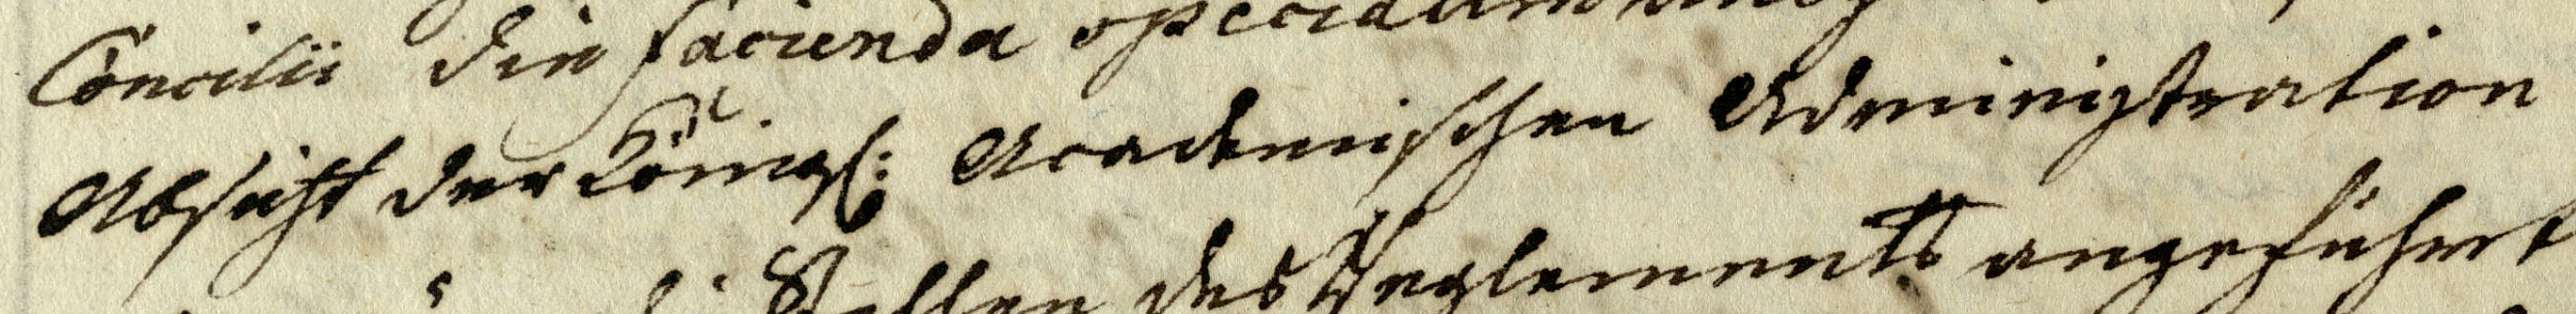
Absicht der Königl. Academischen Administration
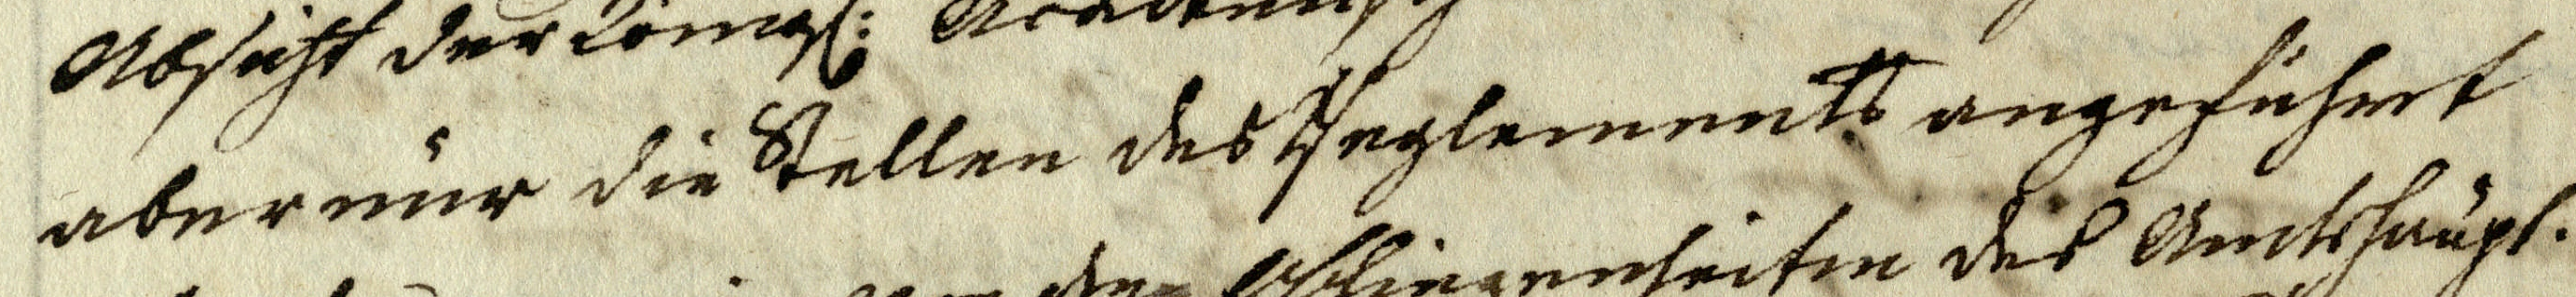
aber nur die Stellen des Reglements angeführet
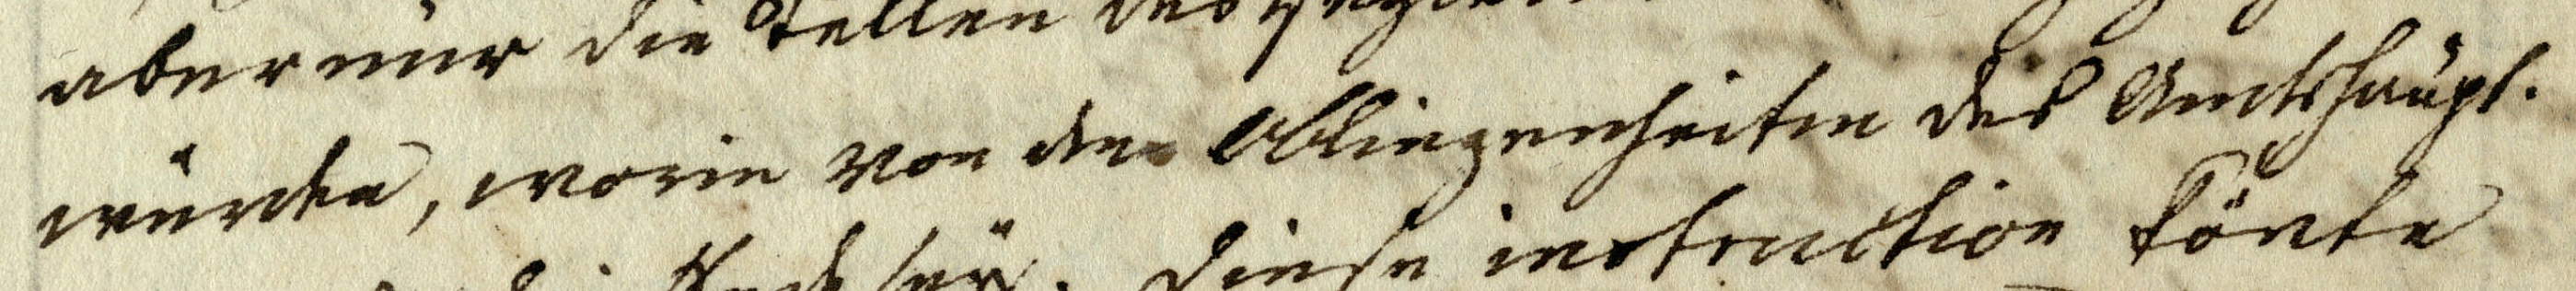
würden, worin von den Obligenheiten des Amtshaupt¬
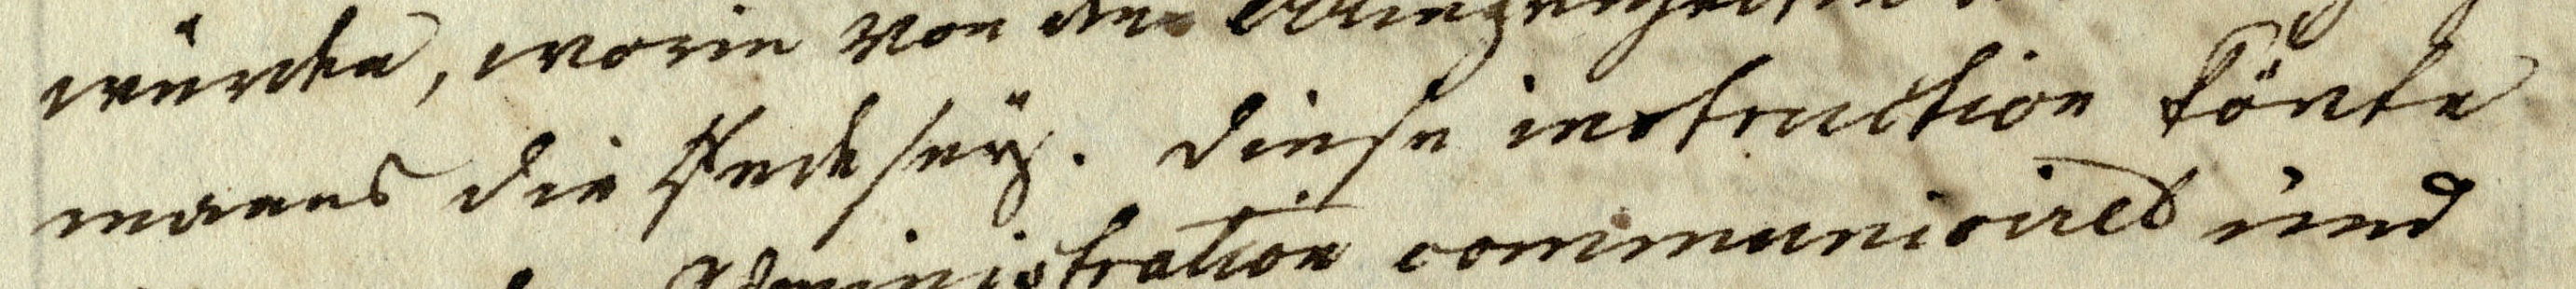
manns die Rede seÿ. Diese instruction könte,
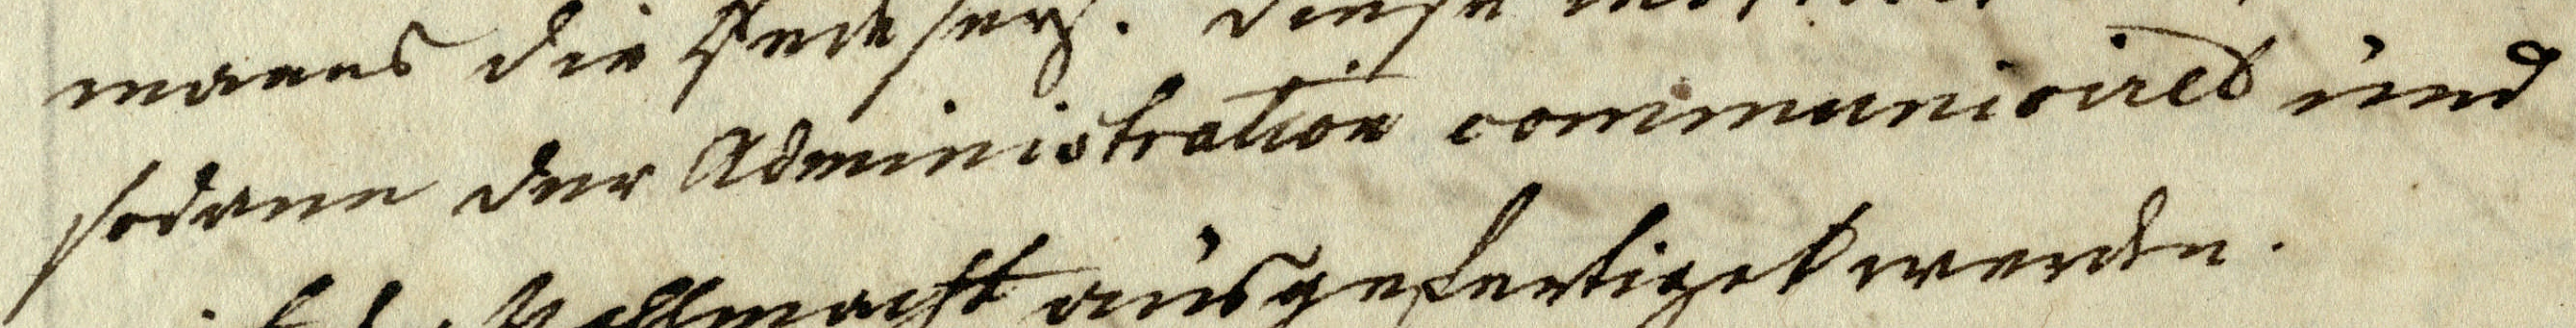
sodann der Administration communiciret und
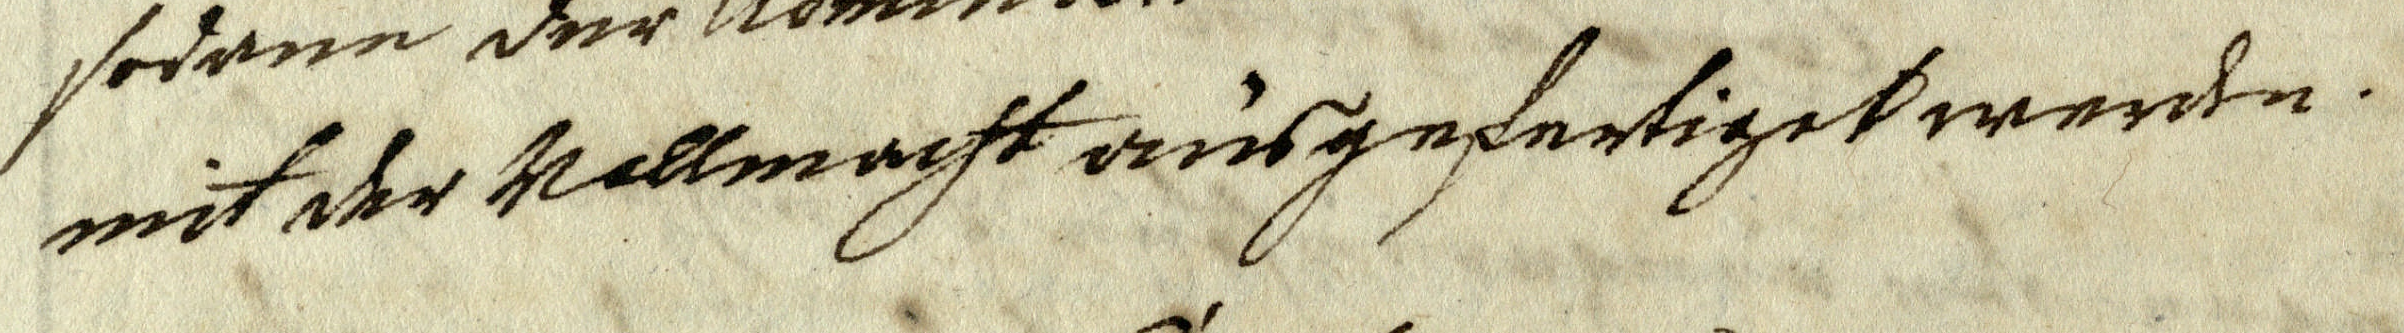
mit der Vollmacht ausgefertigt werden.
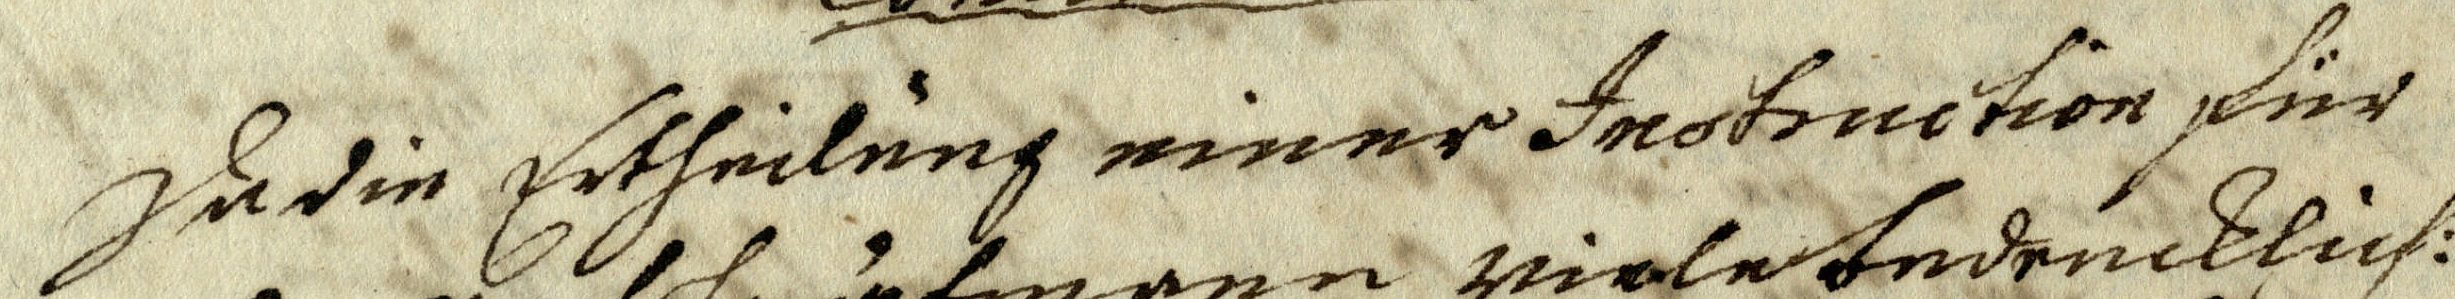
Da die Ertheilung einer Instruction für
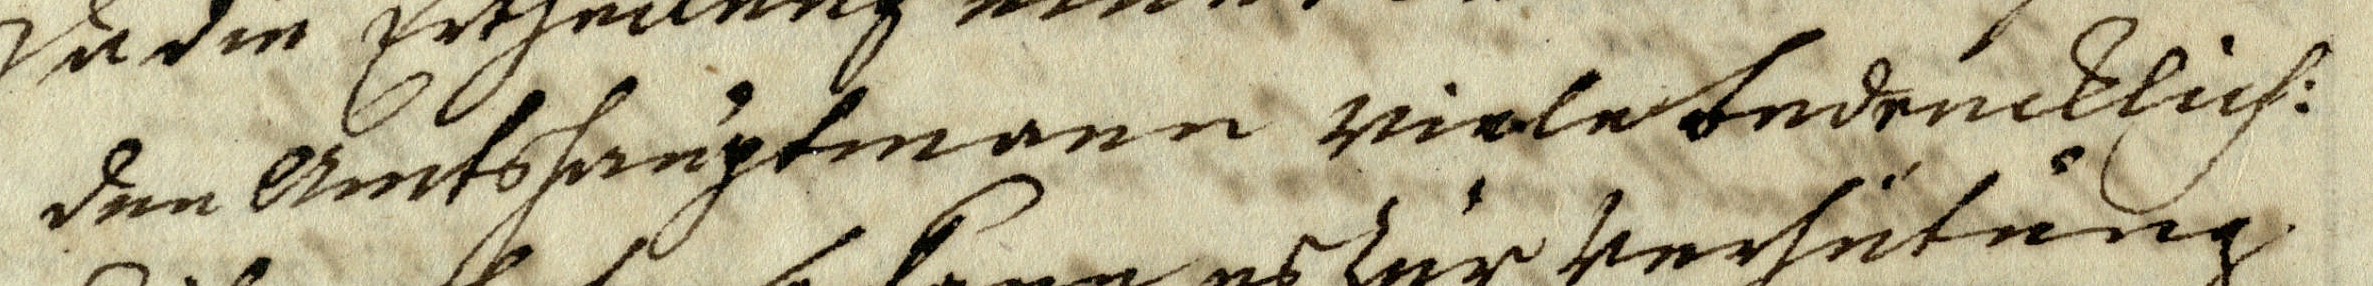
den Amtshauptmann viele Bedencklich¬
